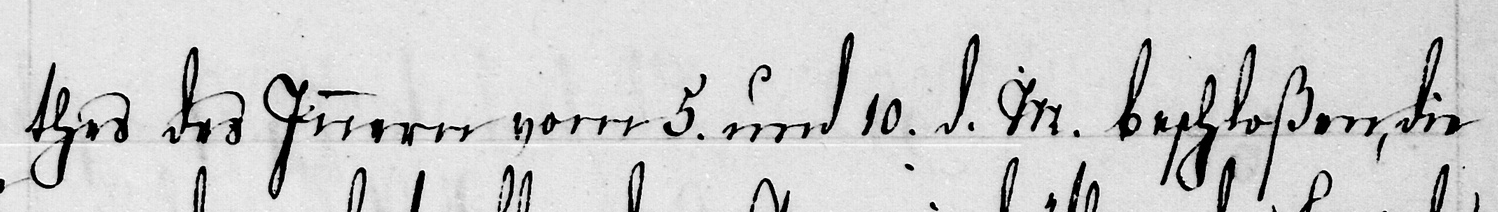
thes des Innern vom 5. und 10. d. M. beschloßen, die
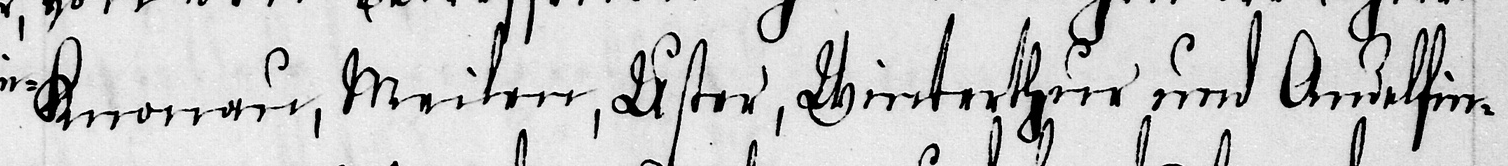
Knonau, Meilen, Uster, Winterthur und Andelfin¬
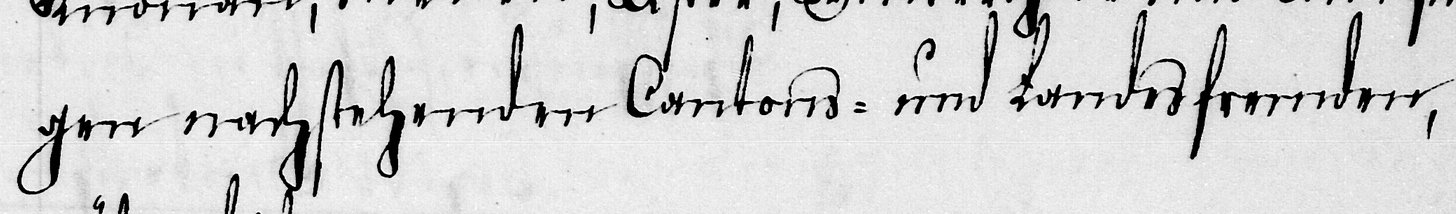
gen nachstehenden Cantons- und Landesfremden,
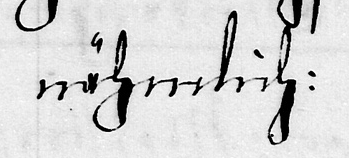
nähmlich:
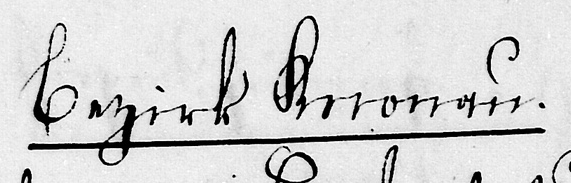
Bezirk Knonau.
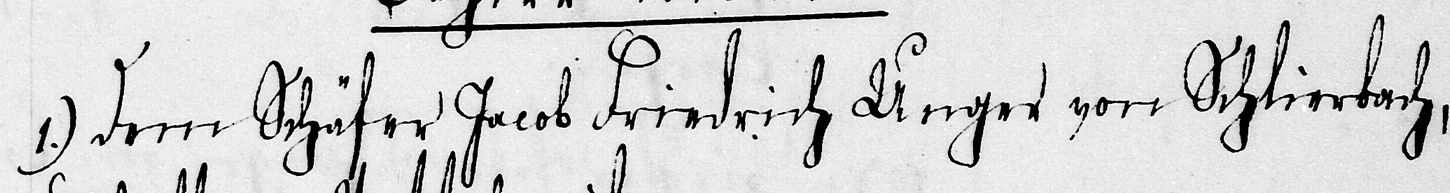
1.) Dem Schüler Jacob Friedrich Unger von Schlierbach,
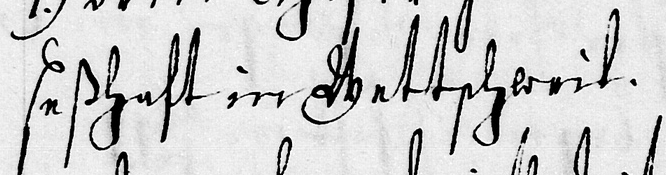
seßhaft in Wettschweil.
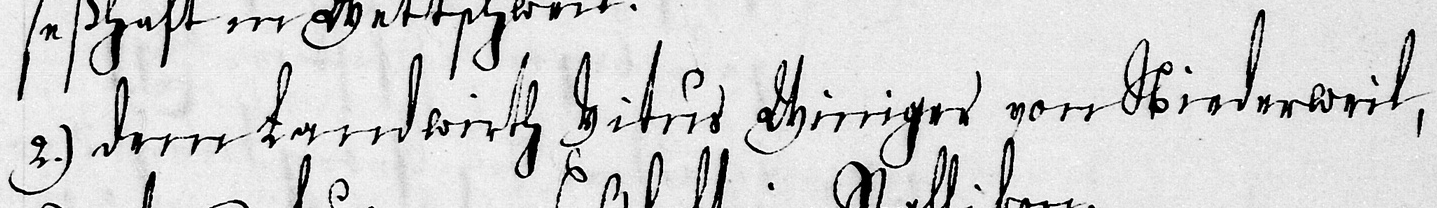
2.) dem Landwirth Vitus Winiger von Niederweil,
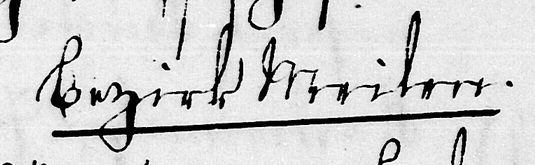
Bezirk Meilen.
